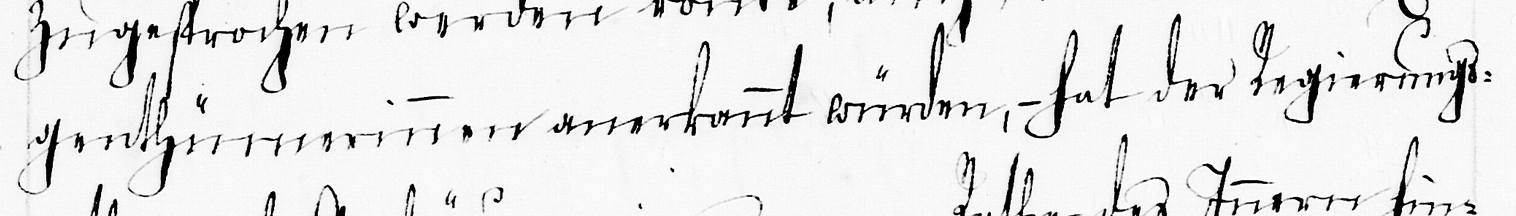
genthümerinnen anerkannt würden, – hat der Regierungs¬
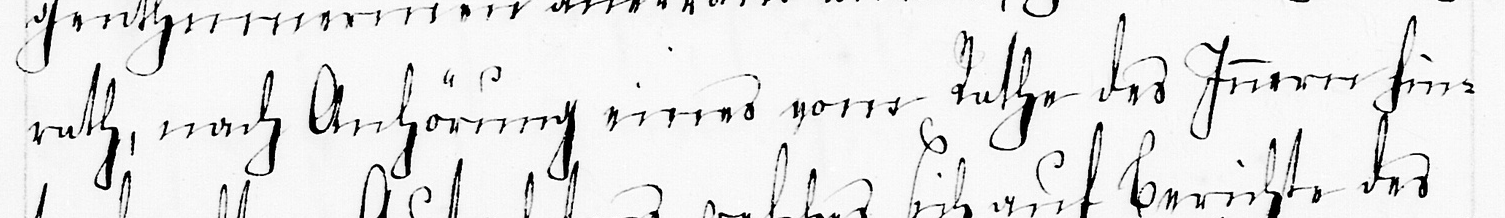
rath, nach Anhörung eines vom Rathe des Innern hin¬
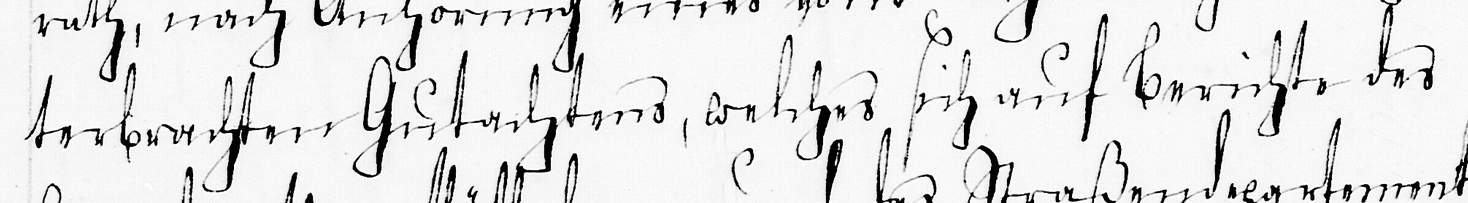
terbrachten Gutachtens, welches sich auf Berichte des
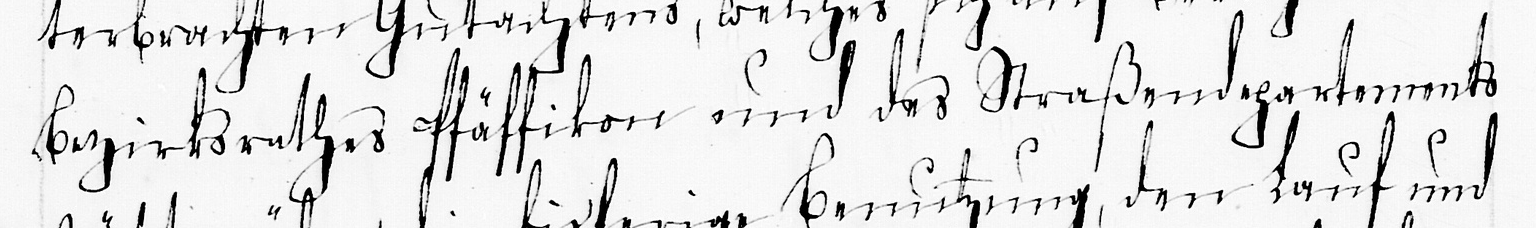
Bezirksrathes Pfäffikon und des Straßendepartements
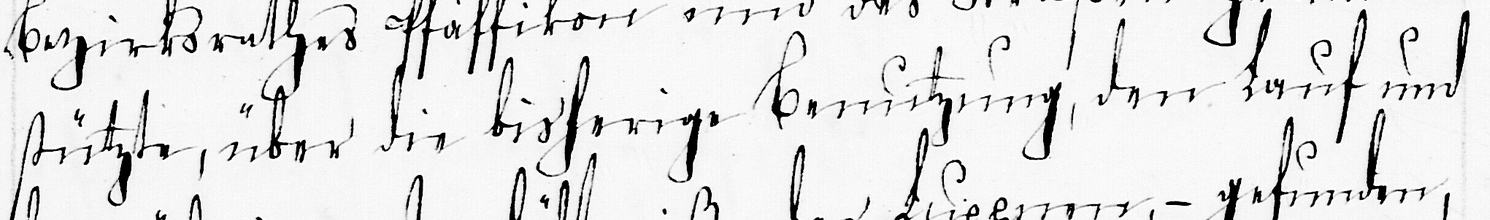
stützte, über die bisherige Benutzung, den Lauf und
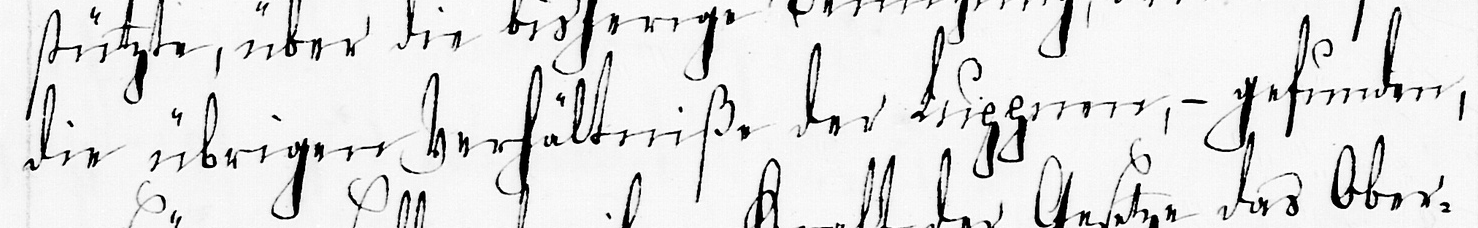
die übrigen Verhältniße der Luppnen, – gefunden,
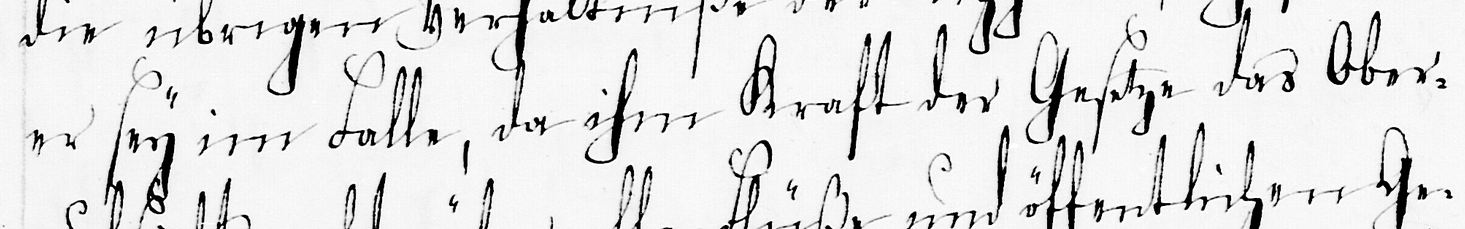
er sey im Falle, da ihm Kraft der Gesetze das Ober¬
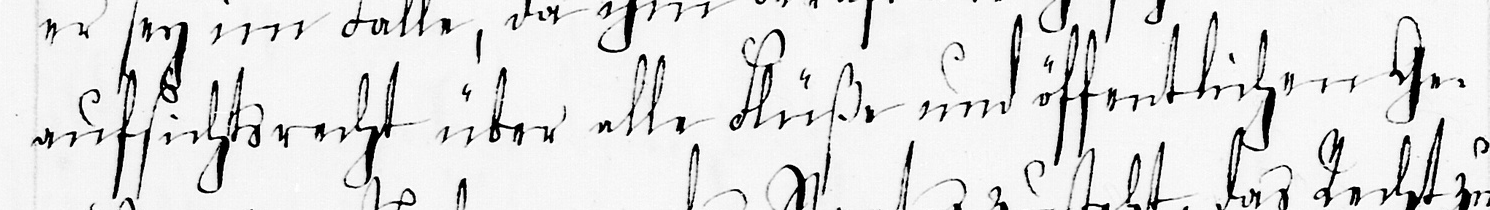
aufsichtsrecht über alle Flüße und öffentlichen Ge¬
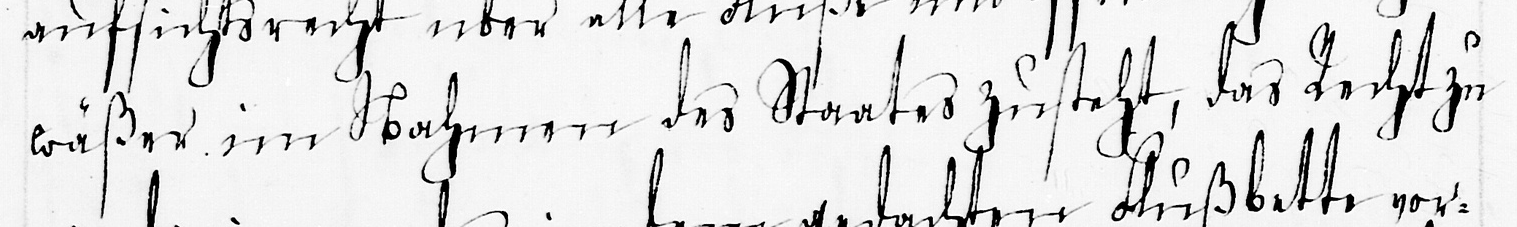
wäßer im Nahmen des Staates zusteht, das Recht zu
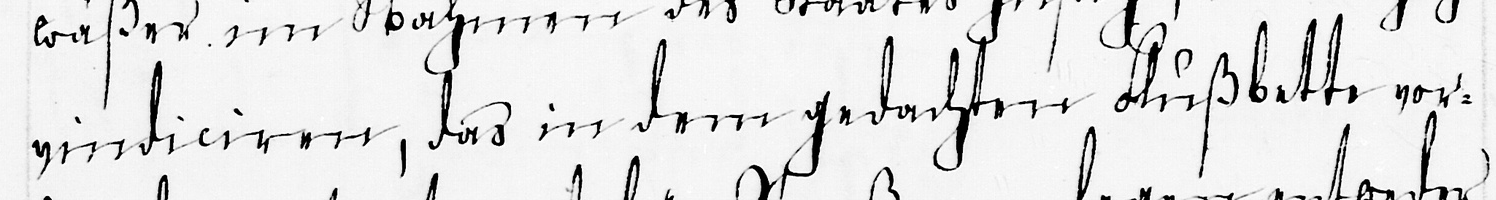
vindiciren, das in dem gedachten Flußbette vor¬
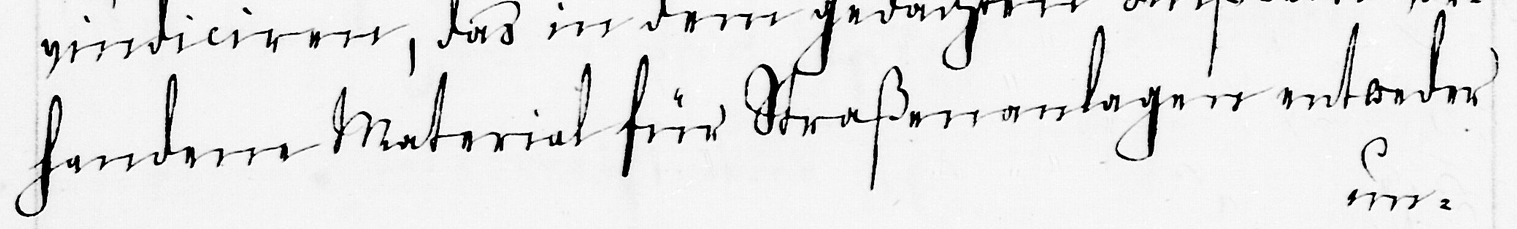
handene Material für Straßenanlagen entweder
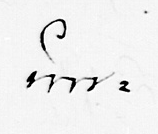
einge¬
